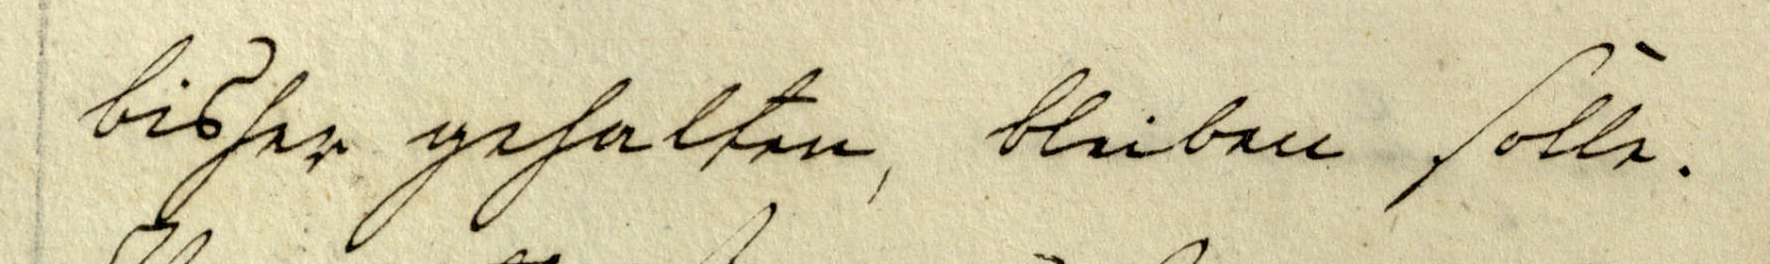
bisher gehalten, bleiben solle.
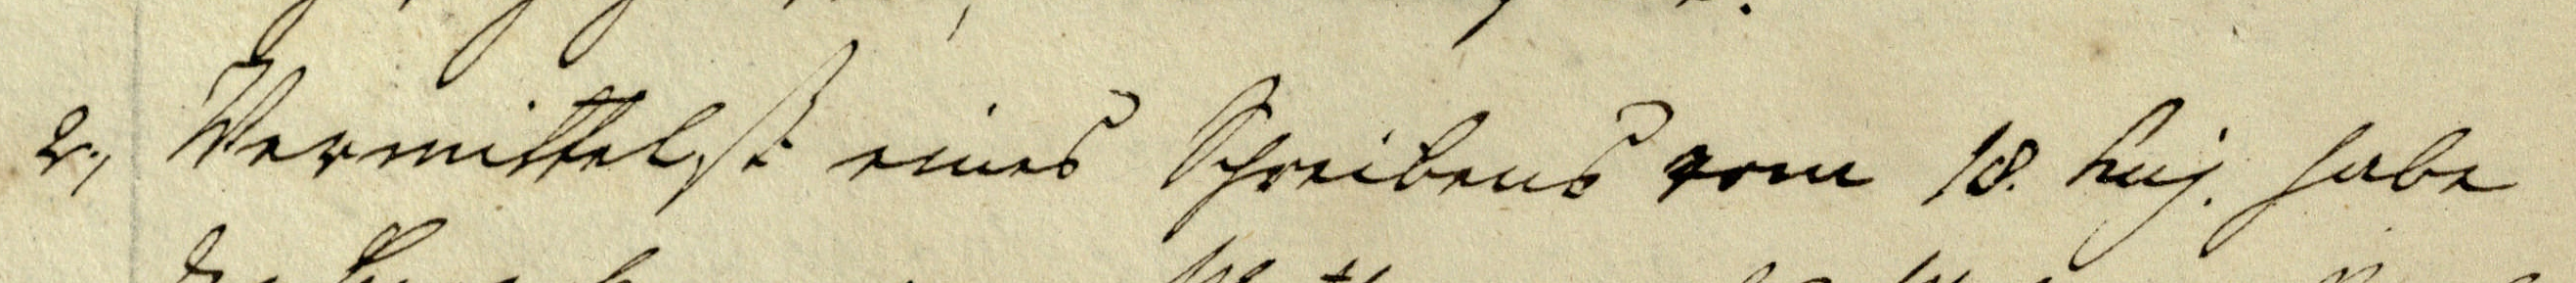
2., Vermittelst eines Schreibens vom 18. huj. habe
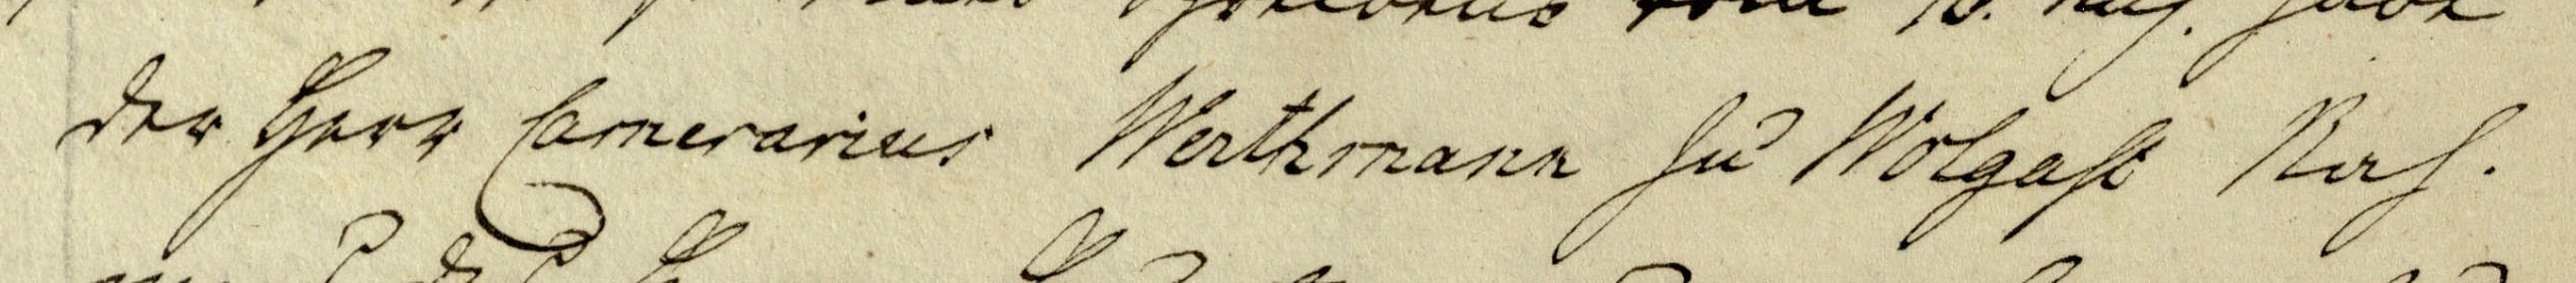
der Herr Camerarius Werthmann zu Wolgast Nah¬
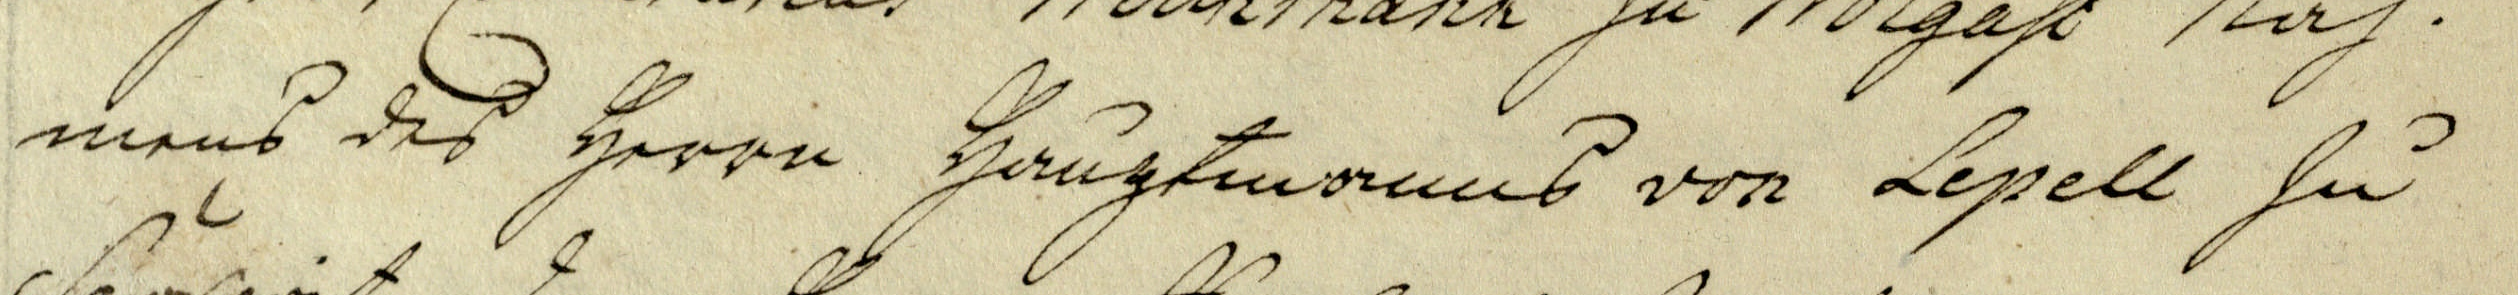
mens des Herrn Hauptmanns von Lepell zu
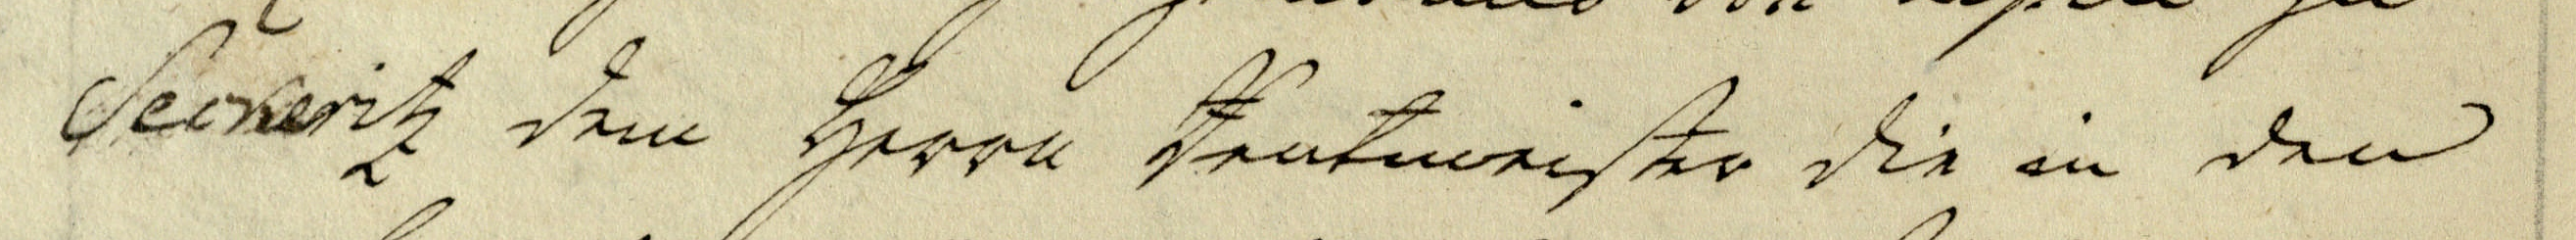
Seckeritz dem Herrn Rentmeister die in den
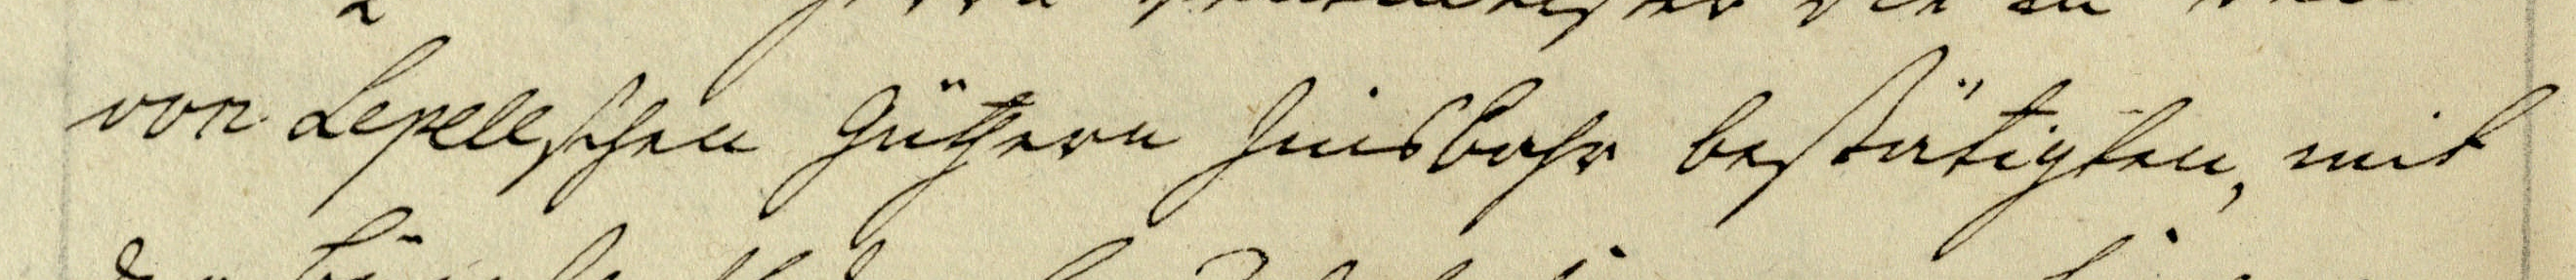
von Lepellschen Güthern zinsbahr bestätigten, mit
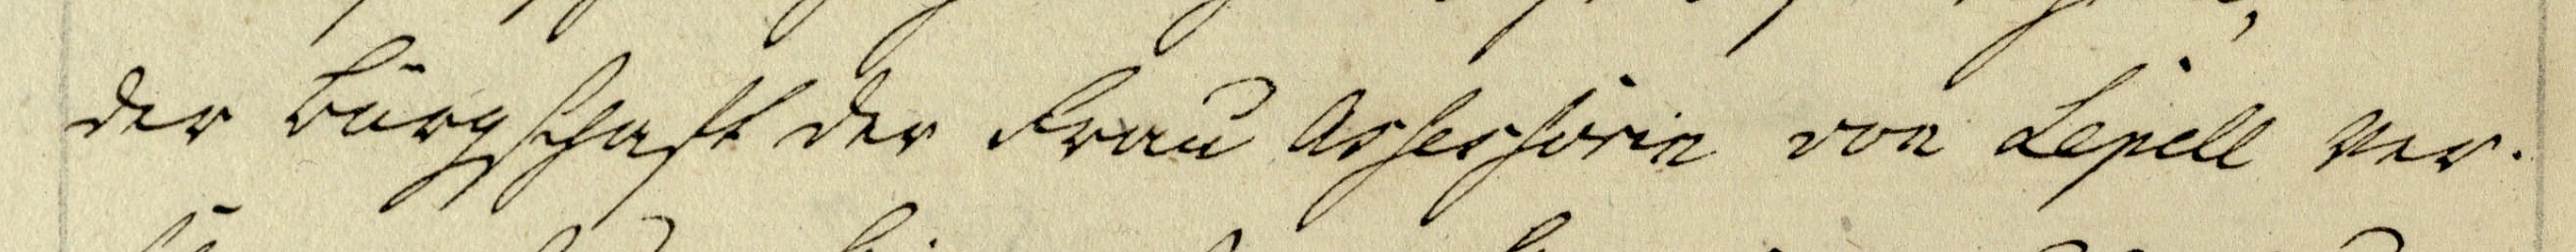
der Bürgschaft der Frau Assessorin von Lepell ver¬
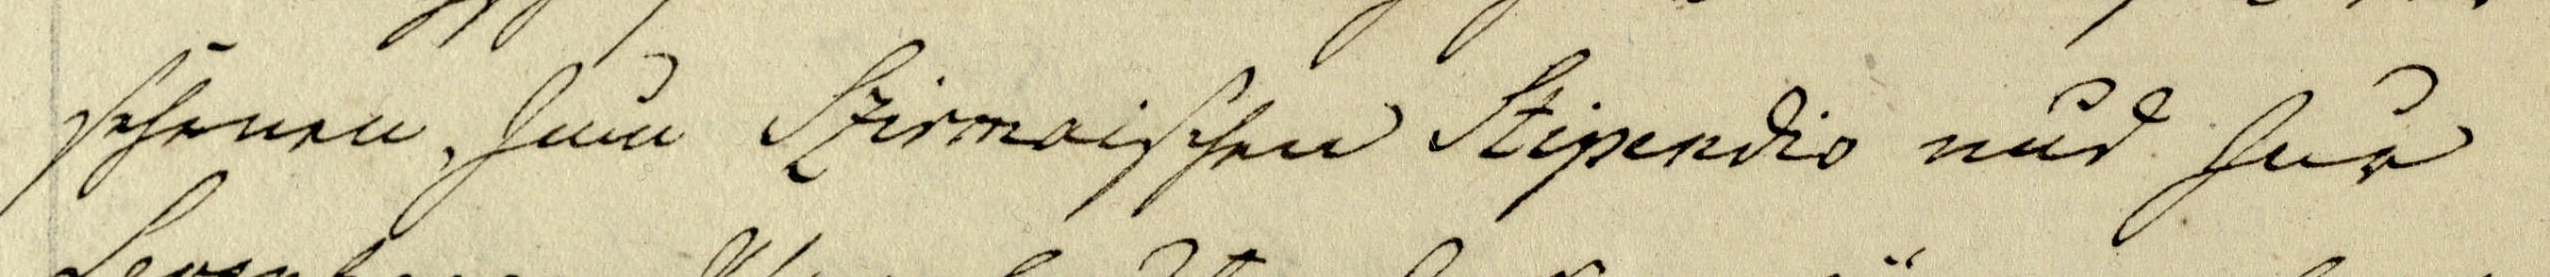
sehenen, zum Szirmaischen Stipendio und zur
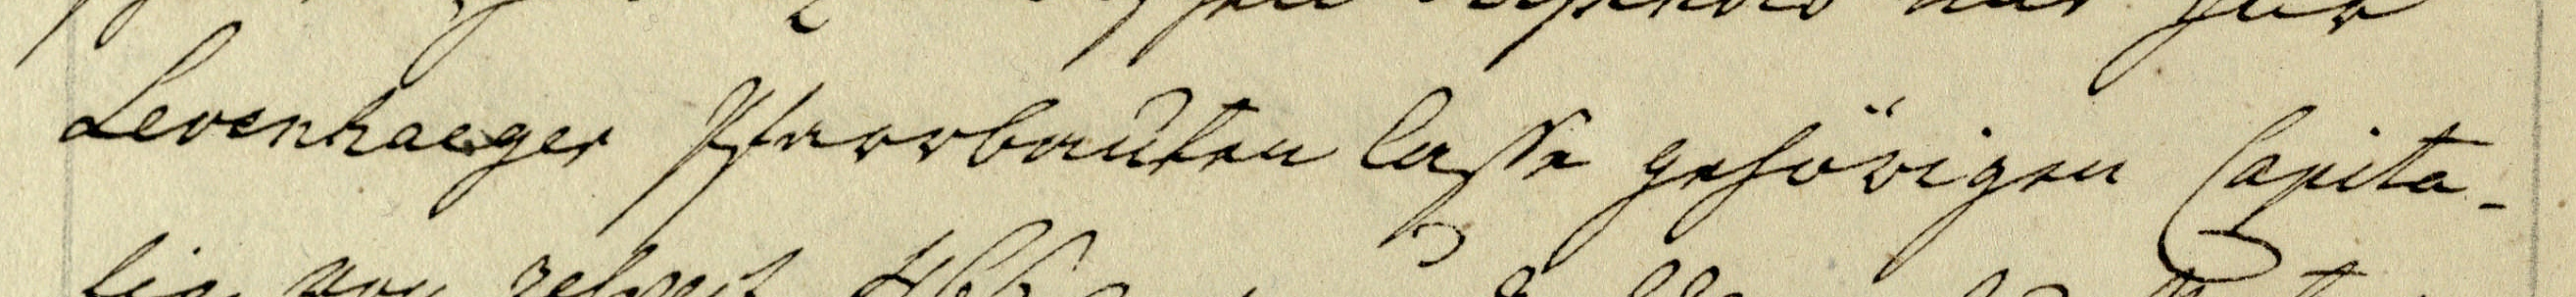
Levenhaeger Pfarrbauten Casse gehörigen Capita¬
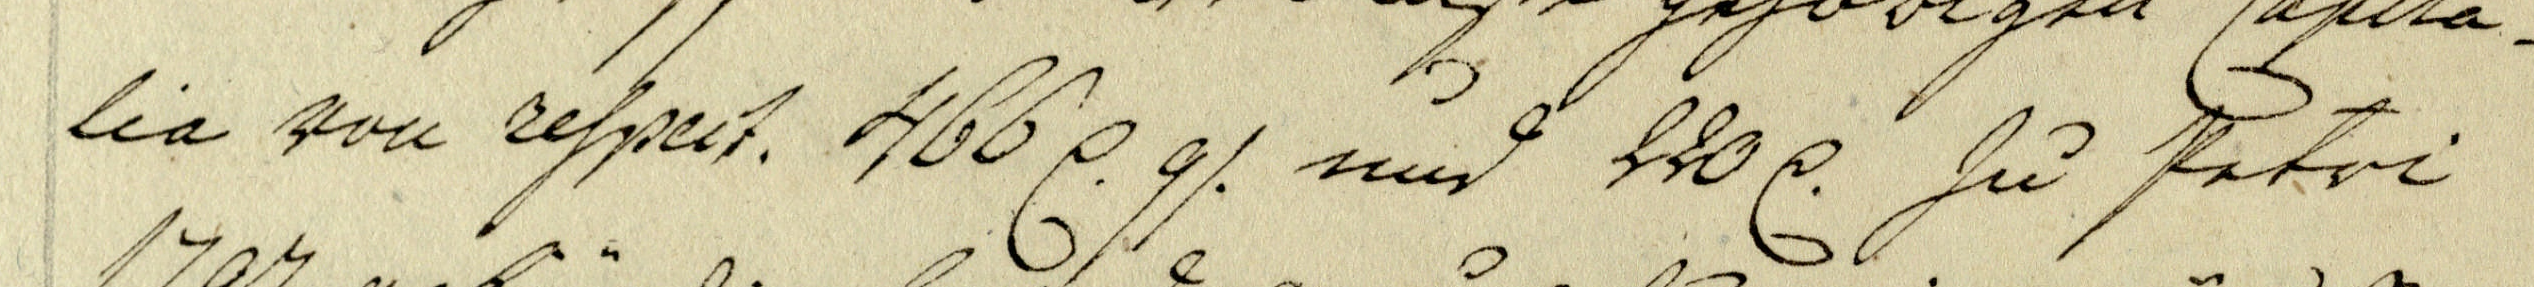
lia von respect. 466 l. 9 s. und 220 l. zu Petri
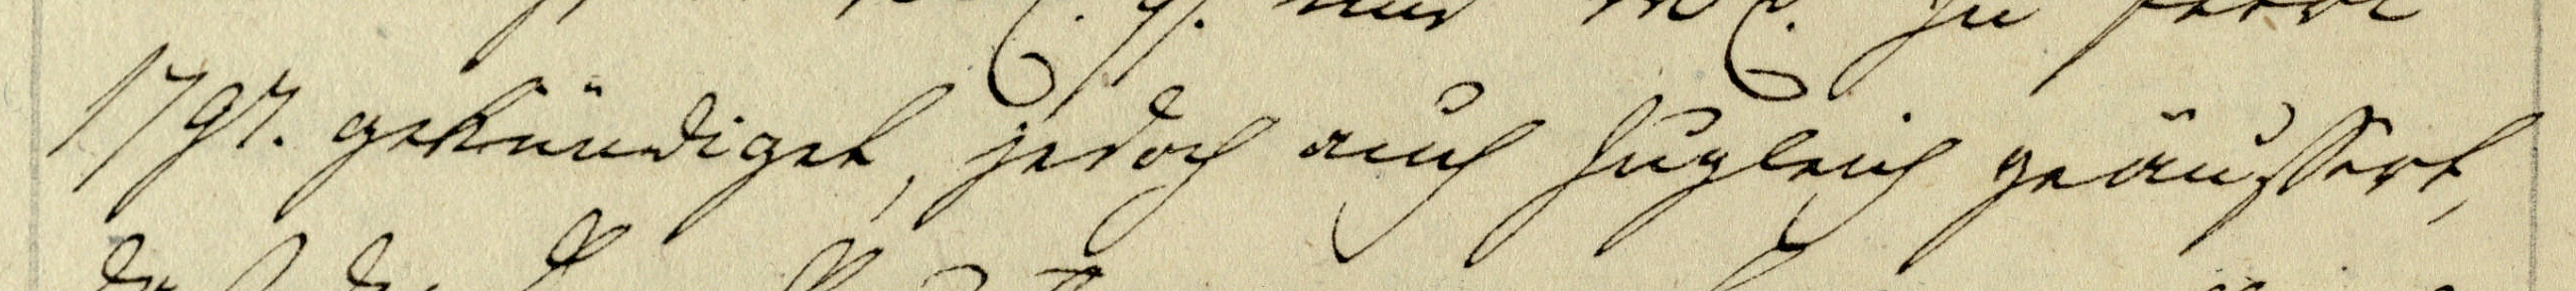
1797. gekündiget, jedoch auch zugleich geäussert,
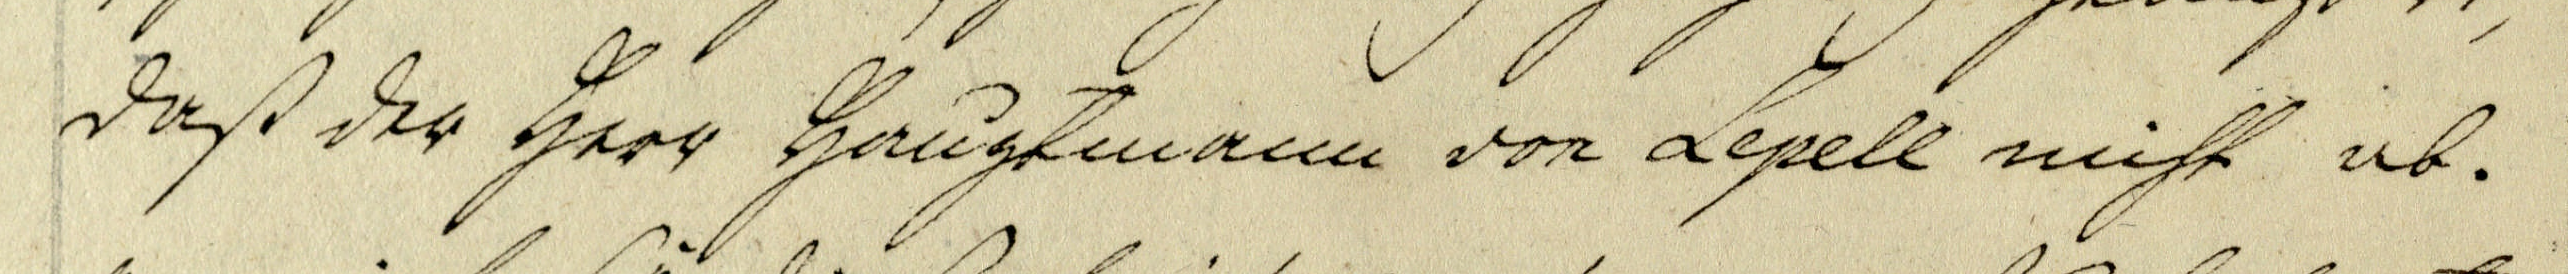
daß der Herr Hauptmann von Lepell nicht ab¬
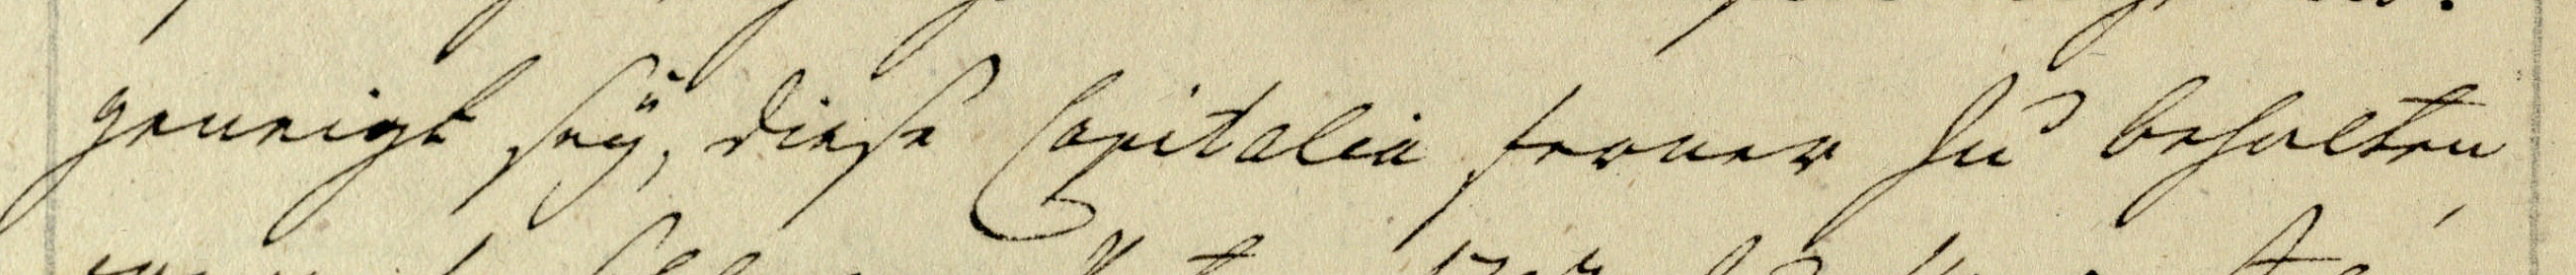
geneigt seÿ, diese Capitalien ferner zu behalten,
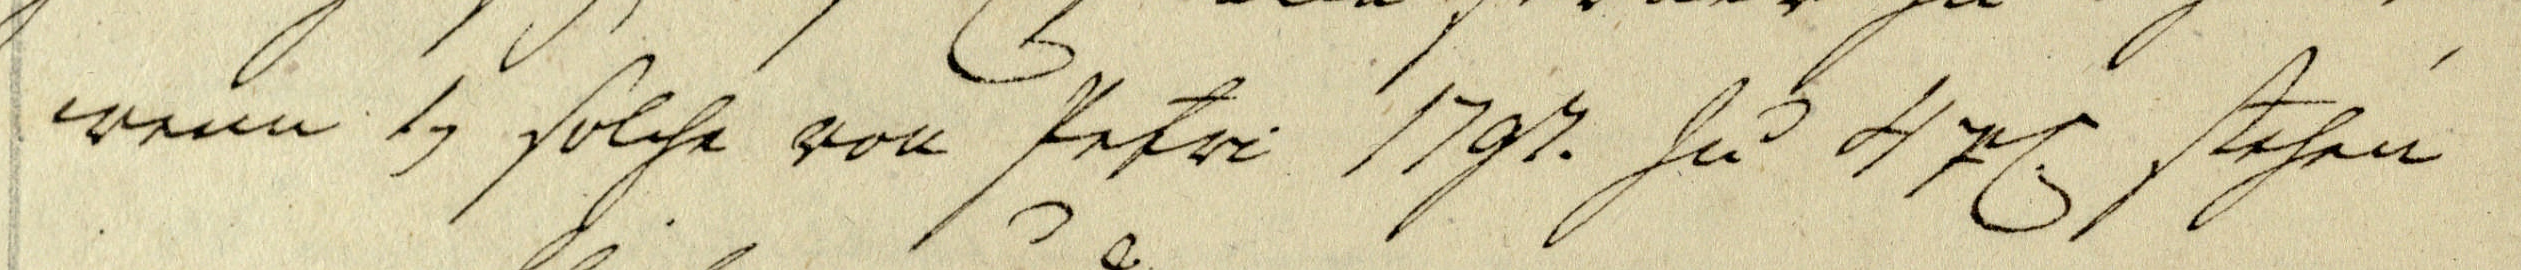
wenn 1, solche von Petri 1797. zu 4 pl. stehen
